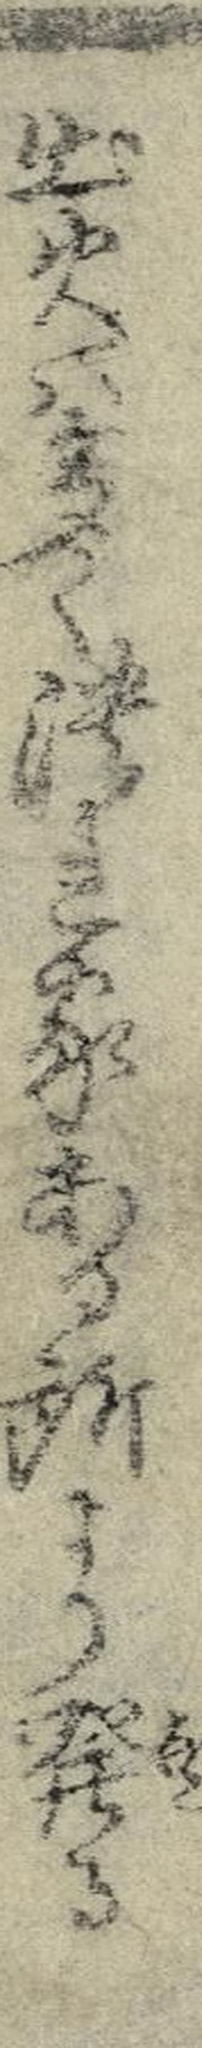出火ハ多く潰れ家ある所より発る

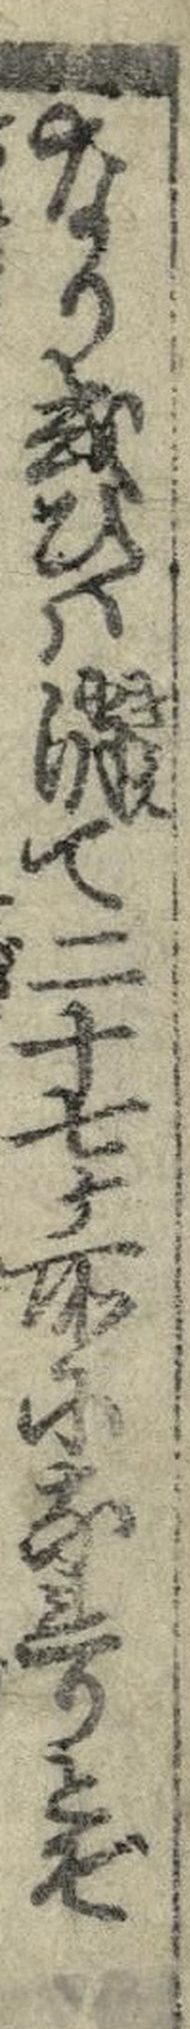なり或ひハ消て二十七カ所になれりとぞ
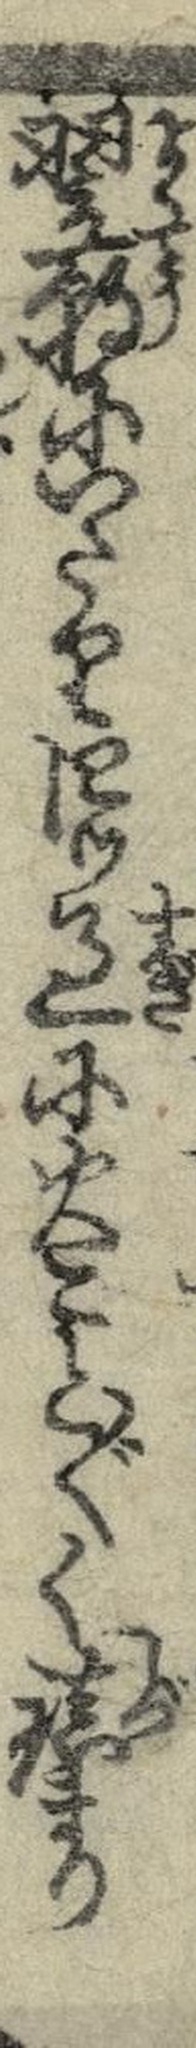翌朝にいたり四ッ過に火こと〴〵く鎮まり
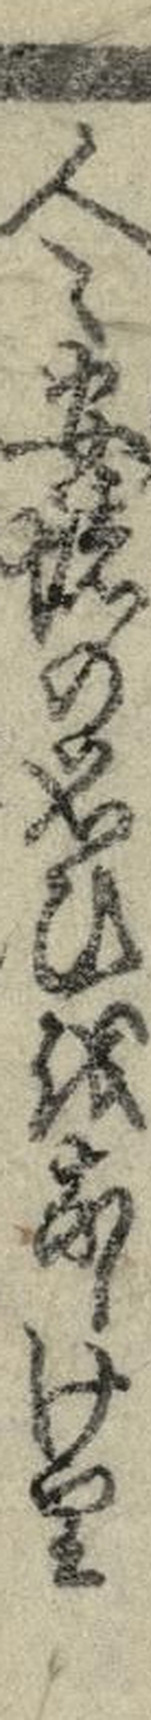人〻安堵の思ひをなしけり
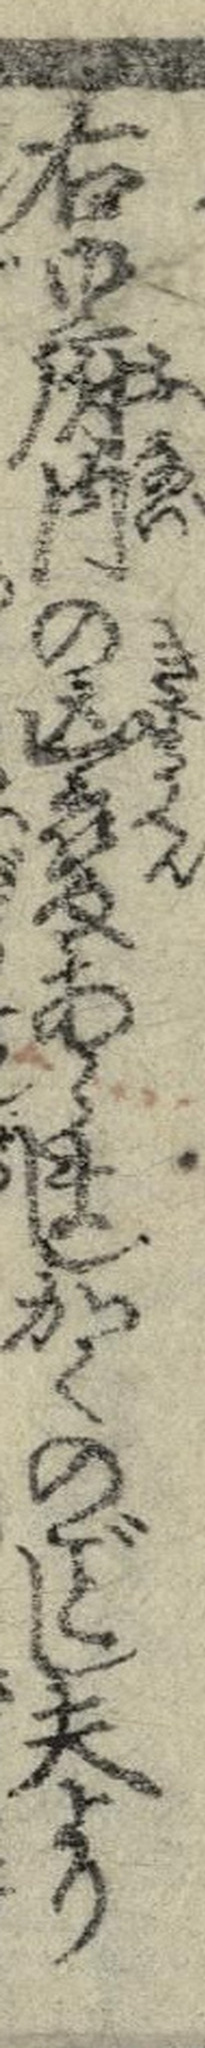右御府内の凶変あらましかくのごとし夫より
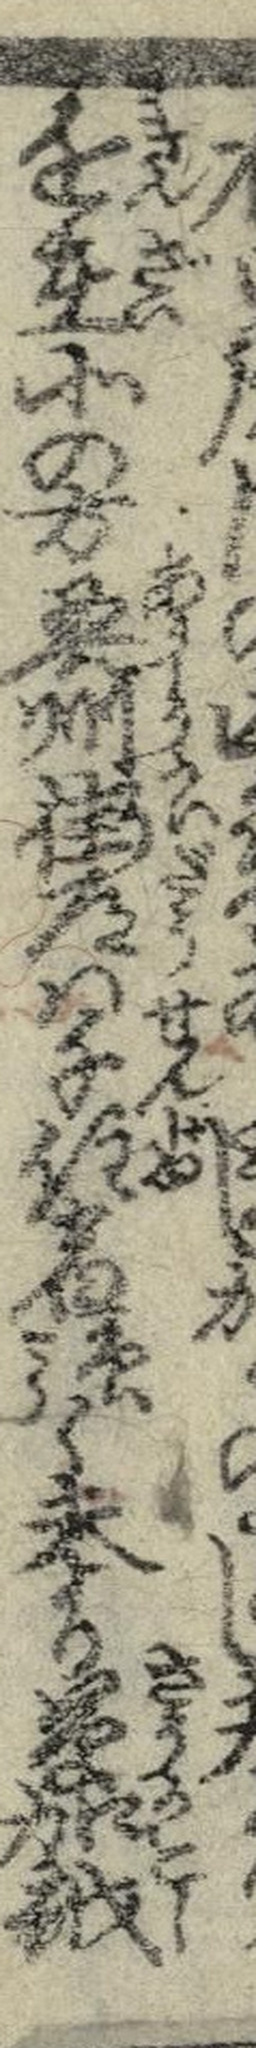近在北の方奥州街道ハ千住宿強く夫より草加越
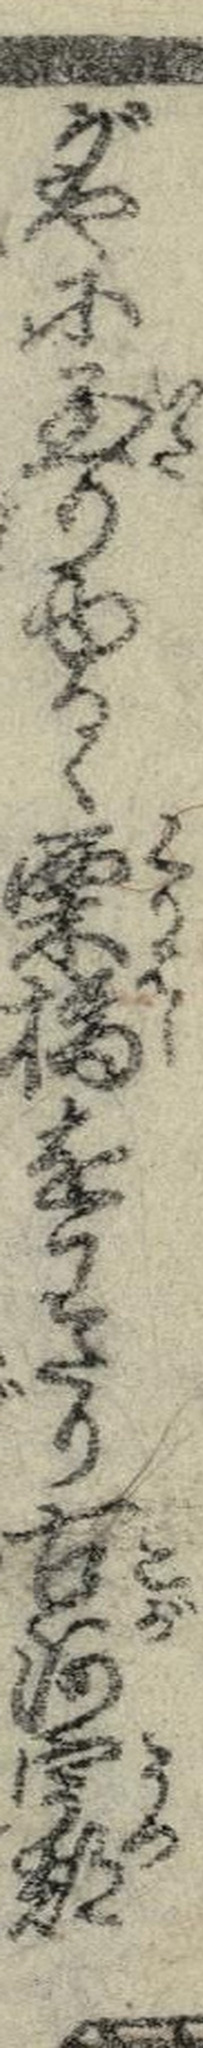がやに至りゆるく栗橋をわたり古河宇都
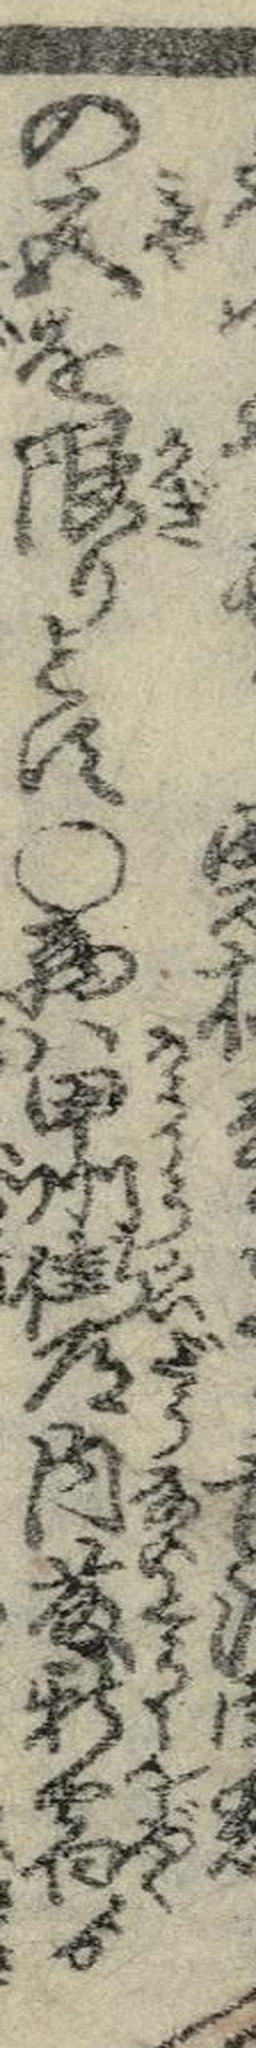の宮を限りとす○西は甲州街道内藤新宿ゟ
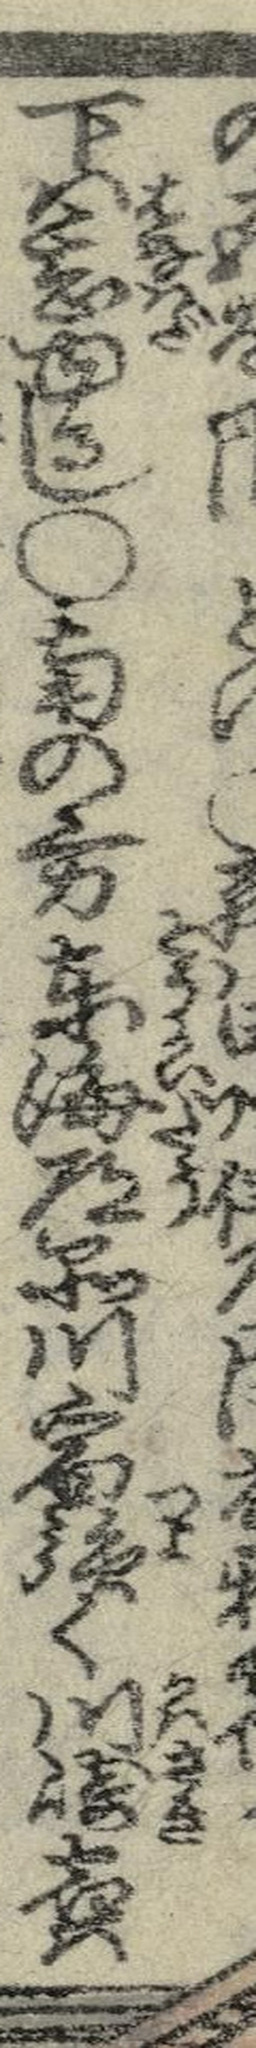下ハ甚ゆるし○南の方東海道品川宿強く川崎宿ハ
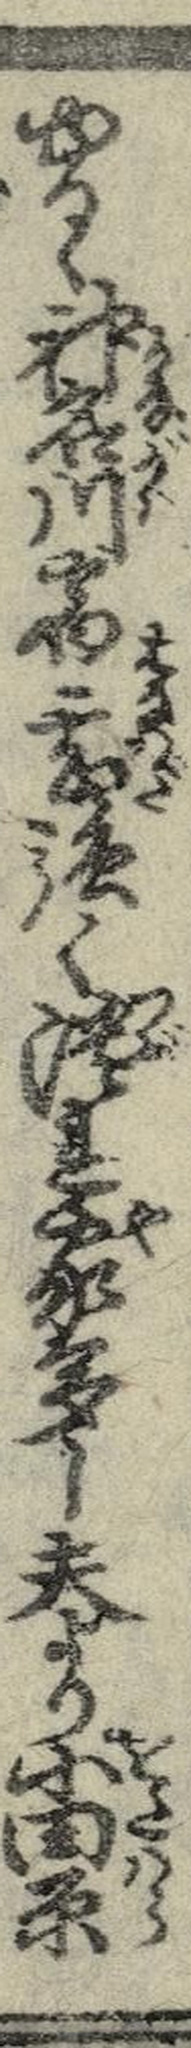ゆるく神名川宿甚強く潰れ家多し夫より小田原
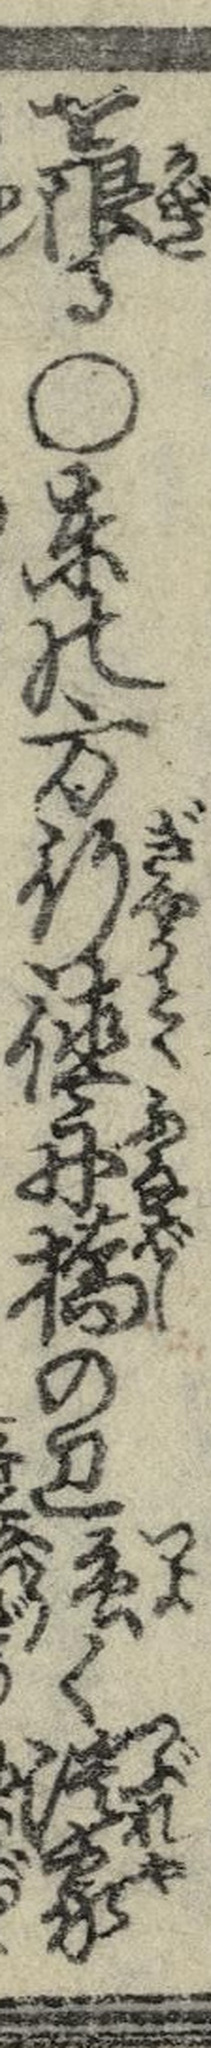を限る○東の方行徳舟橋の辺強く潰家
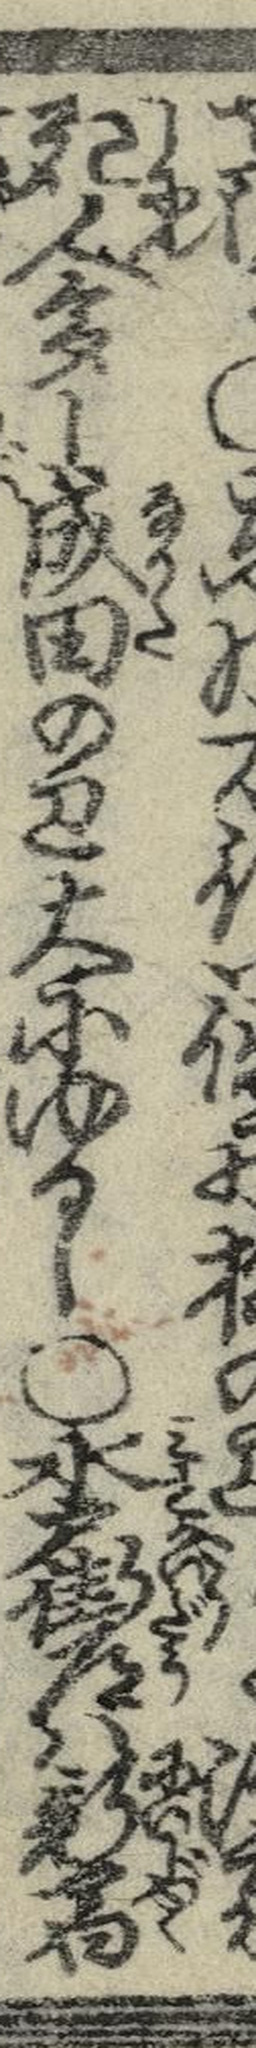死人多し成田の辺大にゆるし○水戸街道ハ新宿
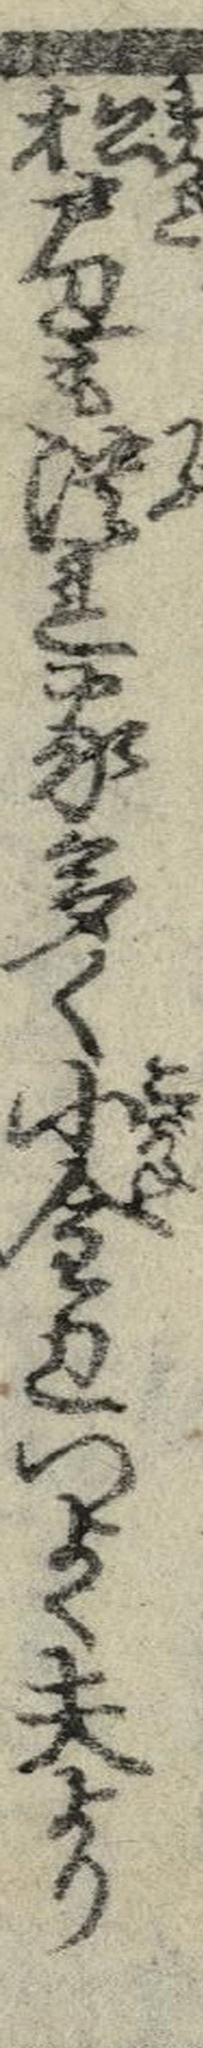松戸辺も潰れ家多く小金辺つよく夫より
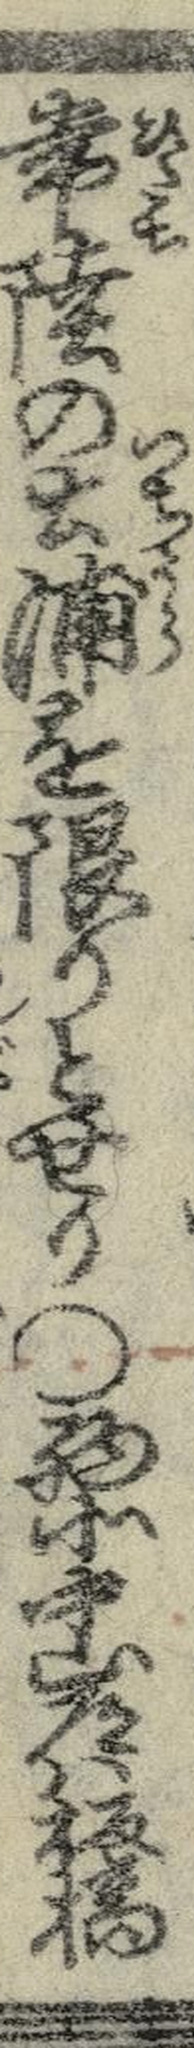常陸の土浦を限りとせり○西北中山道ハ板橋
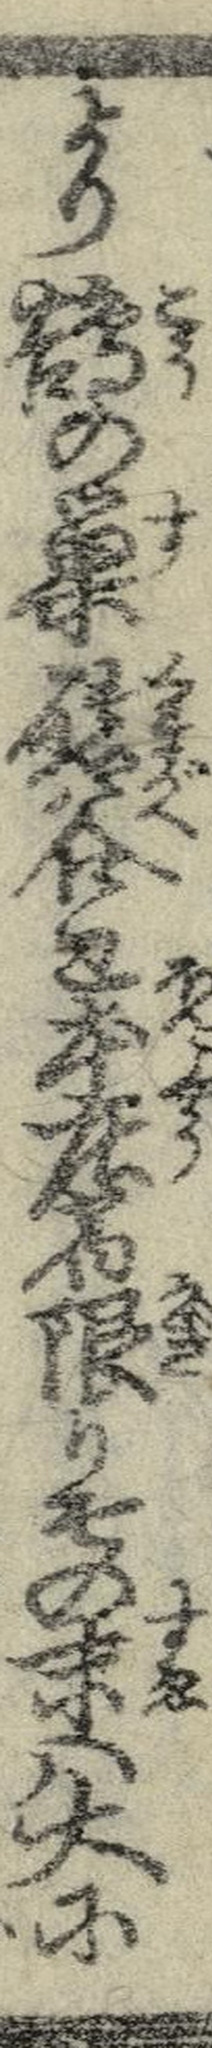より鸛の巣熊谷辺本庄宿限りその末ハ大に
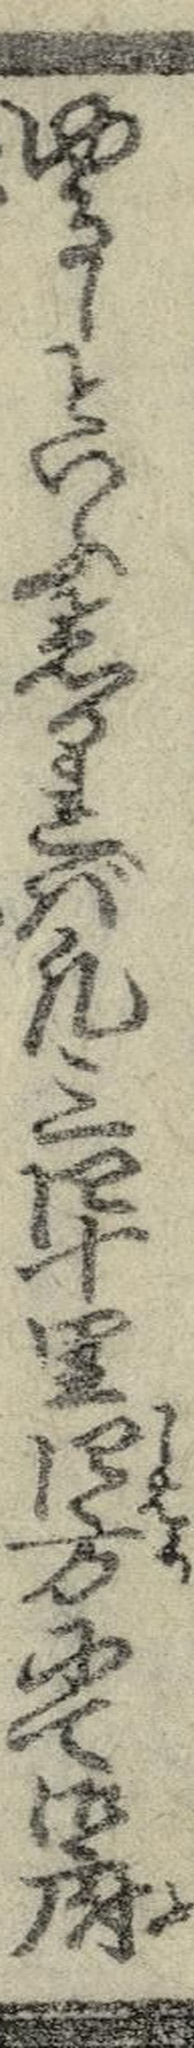ゆるしといふしかれば凡三四十里四方にて御府
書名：地震並出火細見記
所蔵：東京大学地震研究所図書室 Earthquake Research Institute Library, The University of Tokyo, JAPAN
